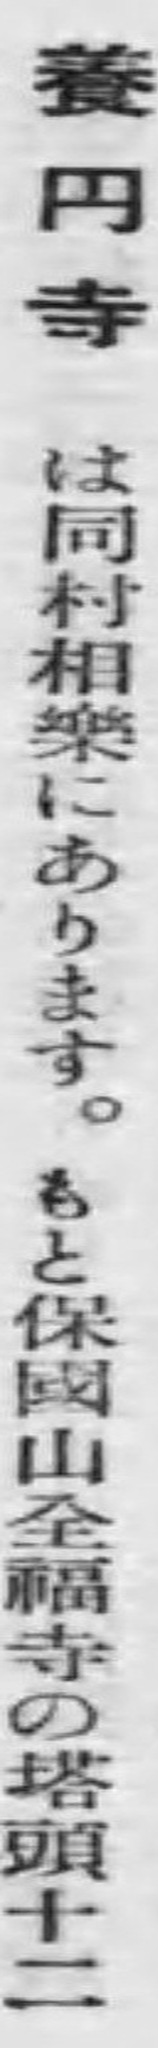養円寺は同村相楽にあります。もと保国山全福寺の塔頭十二
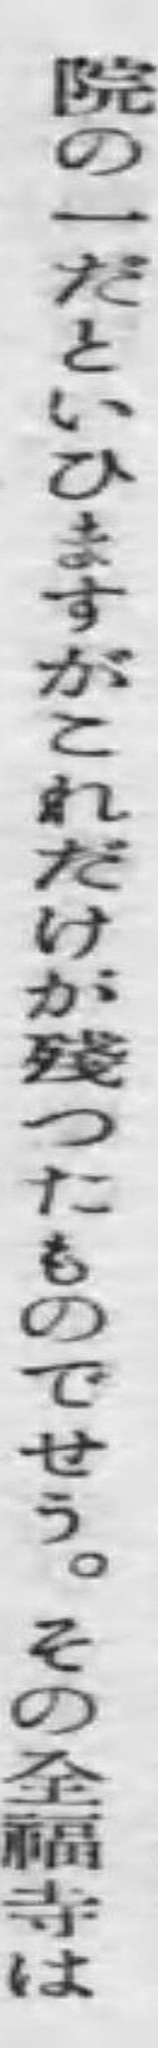院の一だといひますがこれだけが残つたものでせう。その全福寺は
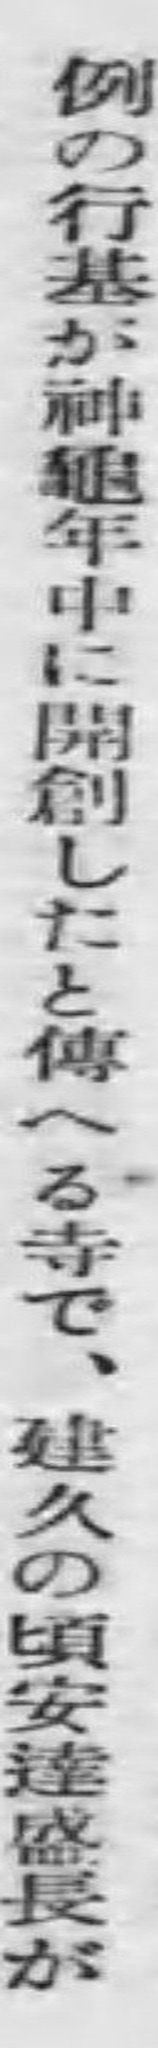例の行基が神亀年中に開創したと伝へる寺で、建久の頃安達盛長が
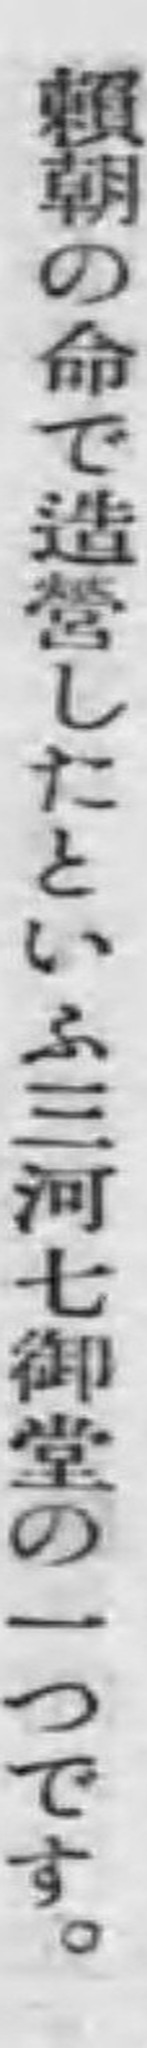頼朝の命で造営したといふ三河七御堂の一つです。
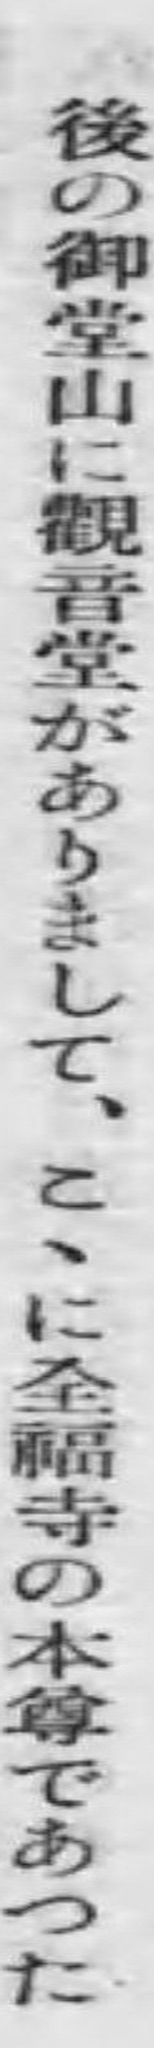後の御堂山に観音堂がありまして、こゝに全福寺の本尊であつた
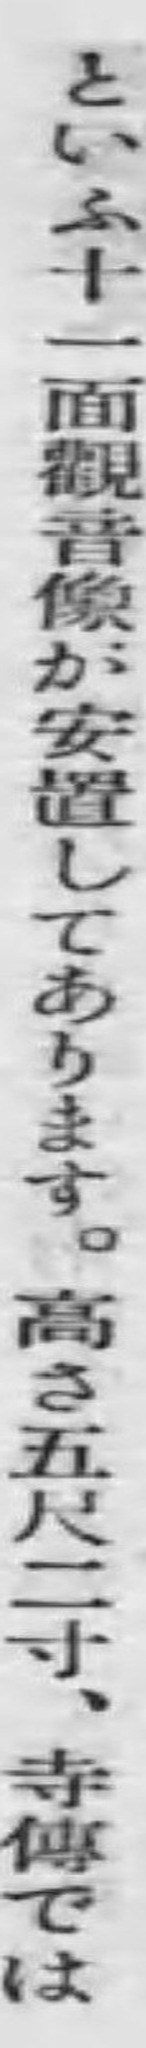といふ十一面観音像が安置してあります。高さ五尺二寸、寺伝では
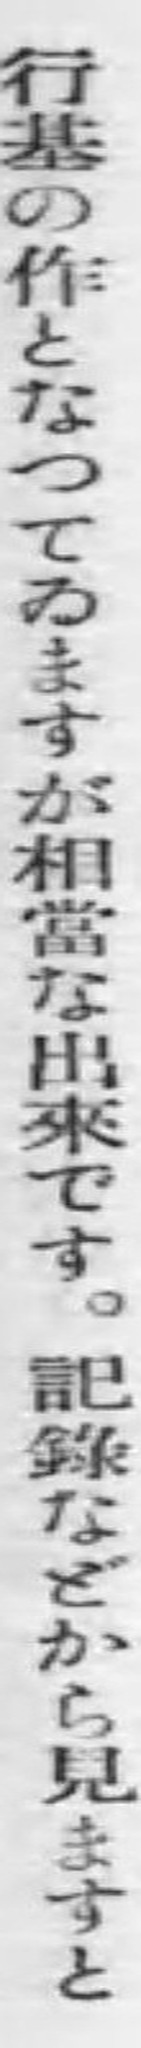行基の作となつてゐますが相当な出来です。記録などから見ますと
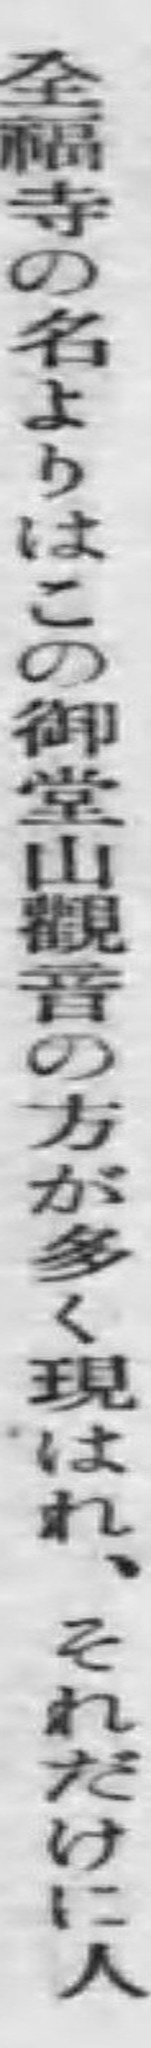全福寺の名よりはこの御堂山観音の方が多く現はれ、それだけに人
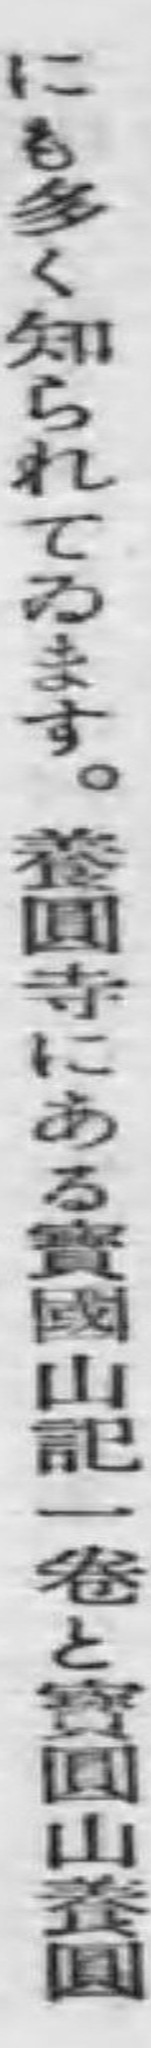にも多く知られてゐます。養円寺にある宝国山記一巻と宝円山養円
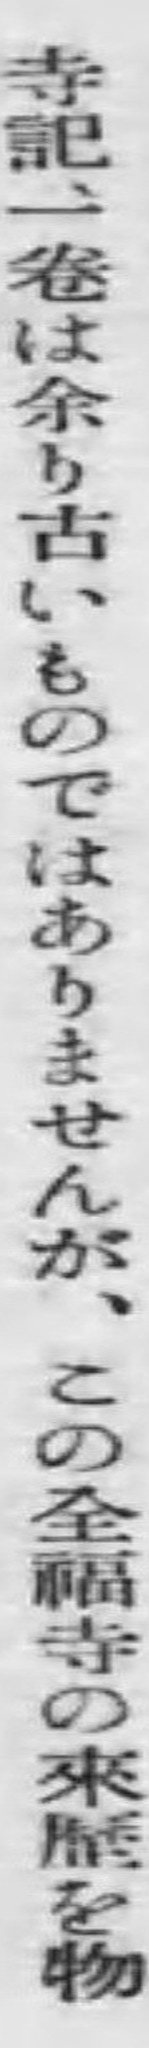寺記一巻は余り古いものではありませんが、この全福寺の来歴を物
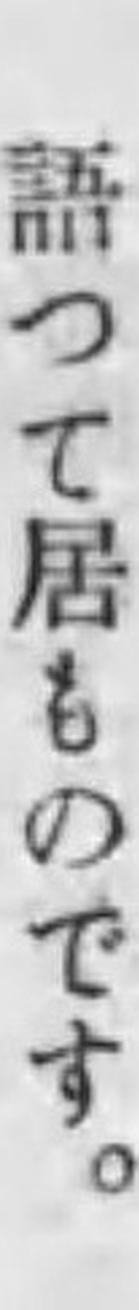語つて居ものです。
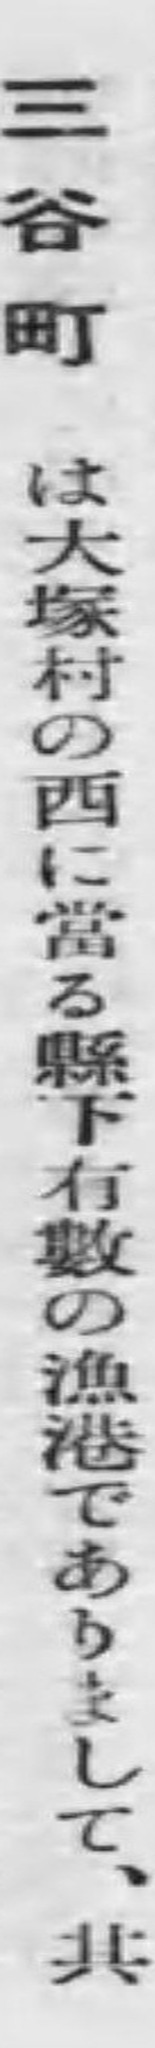三谷町は大塚村の西に当る県下有数の漁港でありまして、其
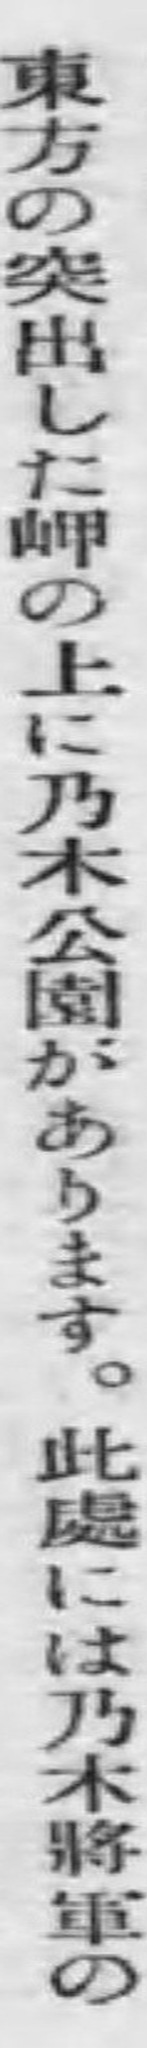東方の突出した岬の上に乃木公園があります。此処には乃木将軍の
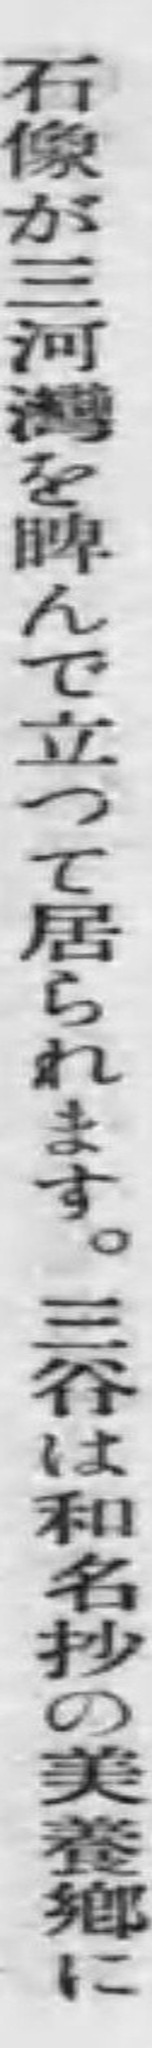石像が三河湾を睥んで立つて居られます。三谷は和名抄の美養郷に
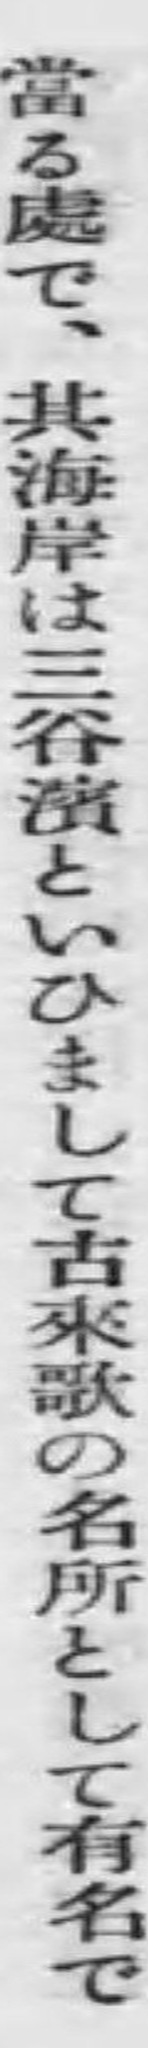当る処で、其海岸は三谷浜といひまして古来歌の名所として有名で
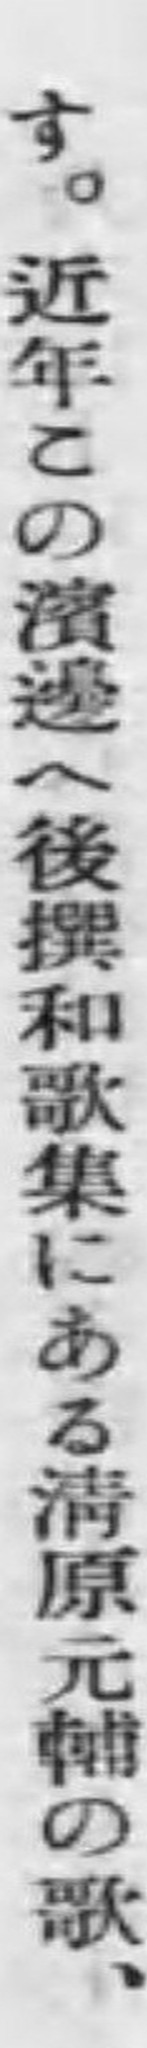す。近年この浜辺へ後撰和歌集にある清原元輔の歌、
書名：東三河道中記 : 豊橋市及其附近案内
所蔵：国立国会図書館 National Diet Library, JAPAN
